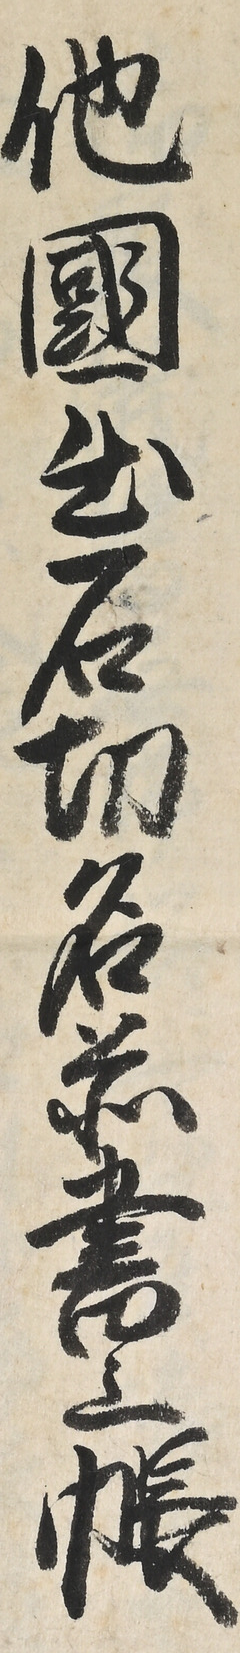他国出石切名前書上帳
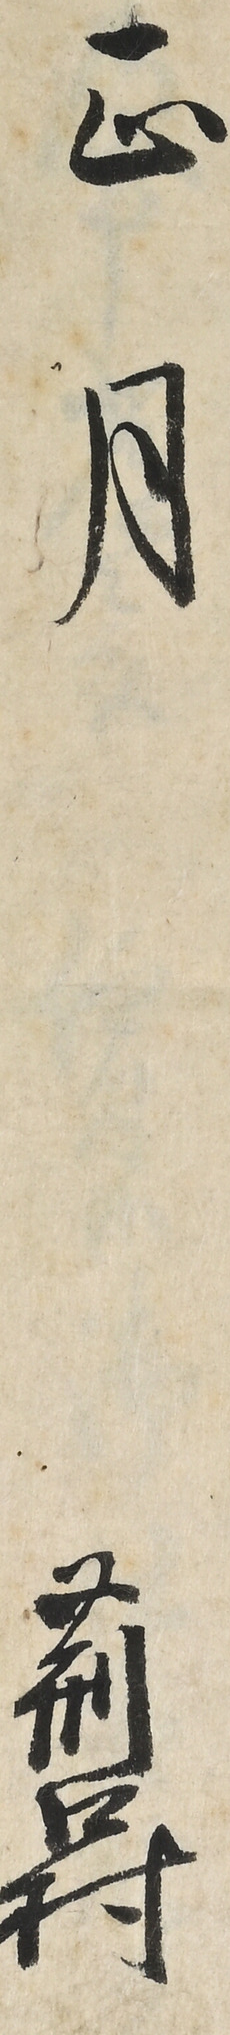正月荊口村

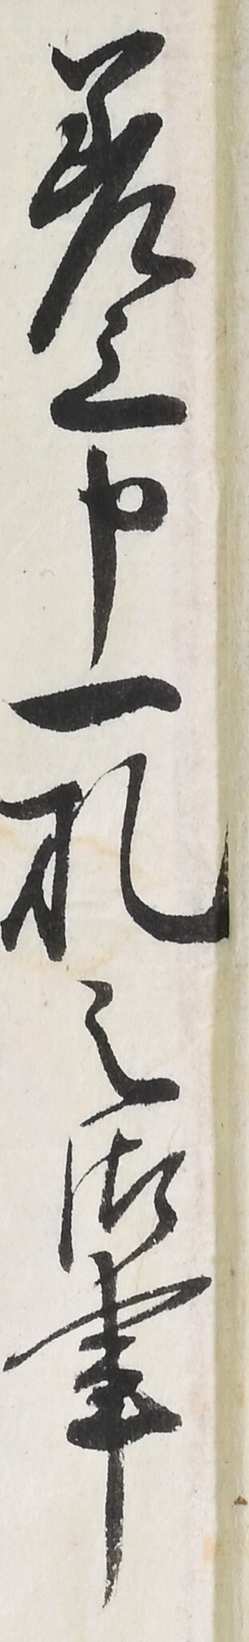差上申一札之御事
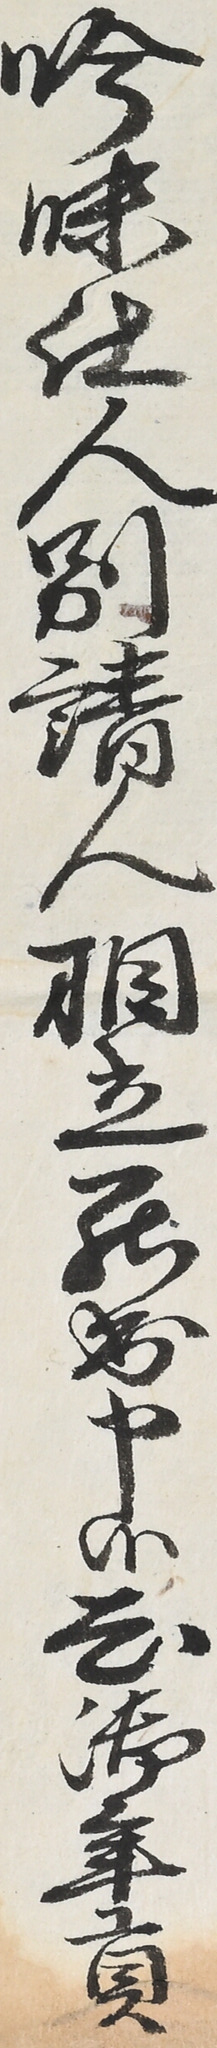吟味仕人別請任相立罷出申候尤御年貢
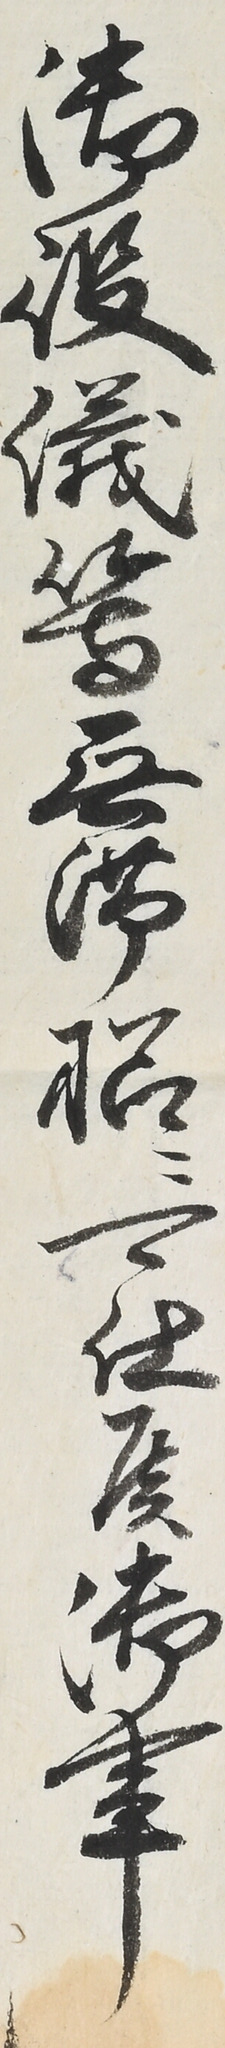御役儀等無滞様ニ可仕候御事
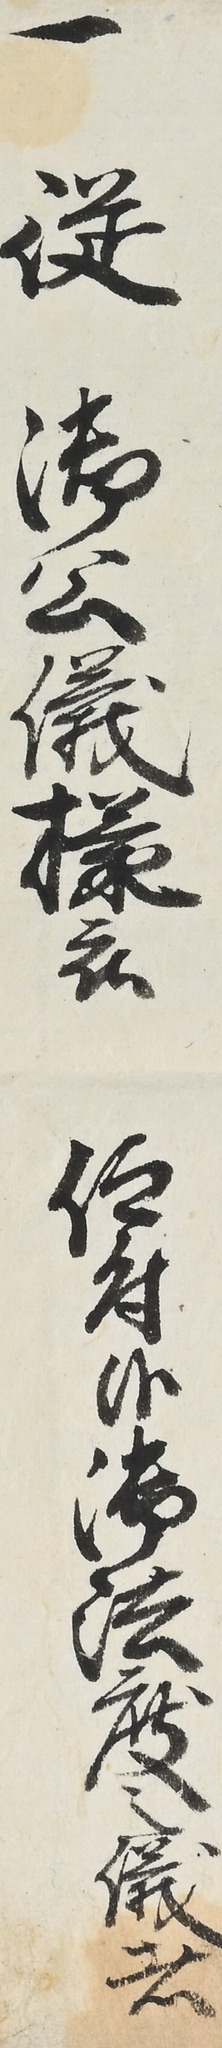一従御公儀様被仰付候御法度之儀は
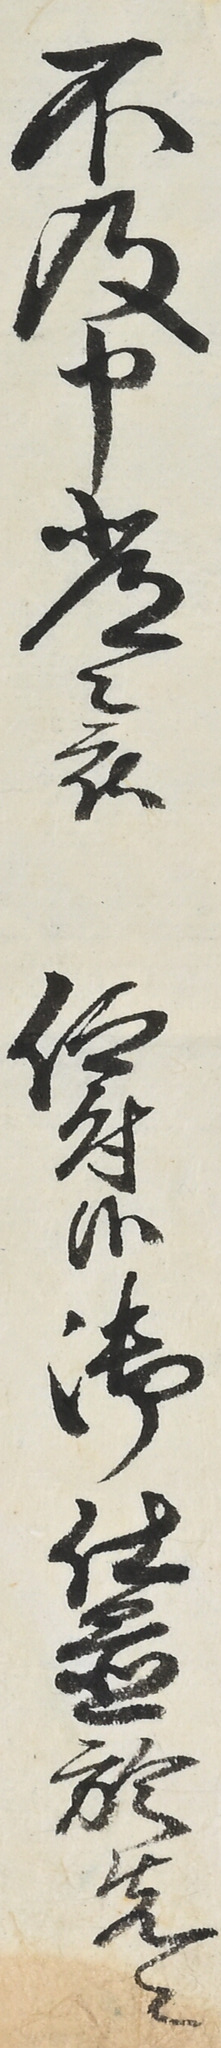不及申常々被仰付候御仕置於先々
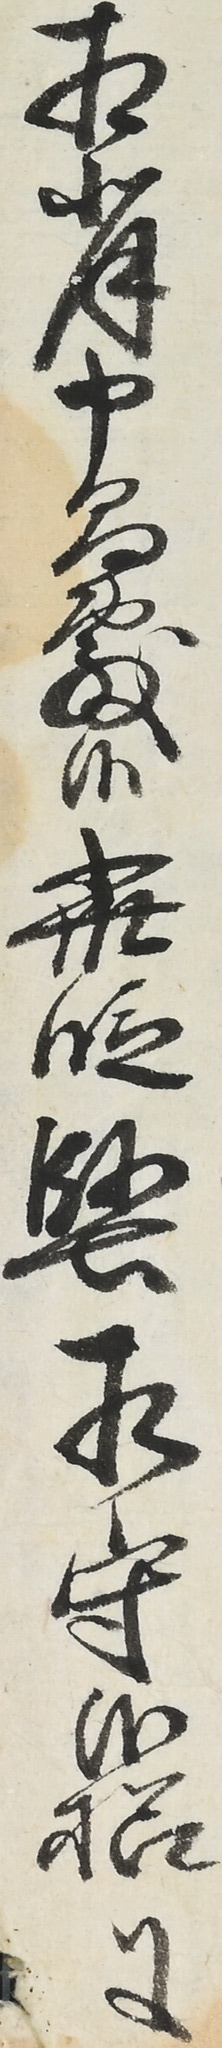相背申間敷候此段堅相守候様に

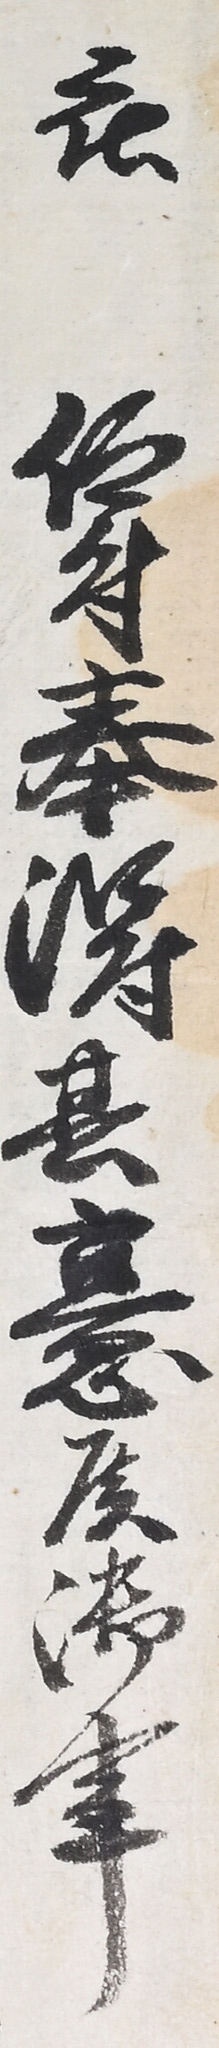被仰付奉得其意候御事
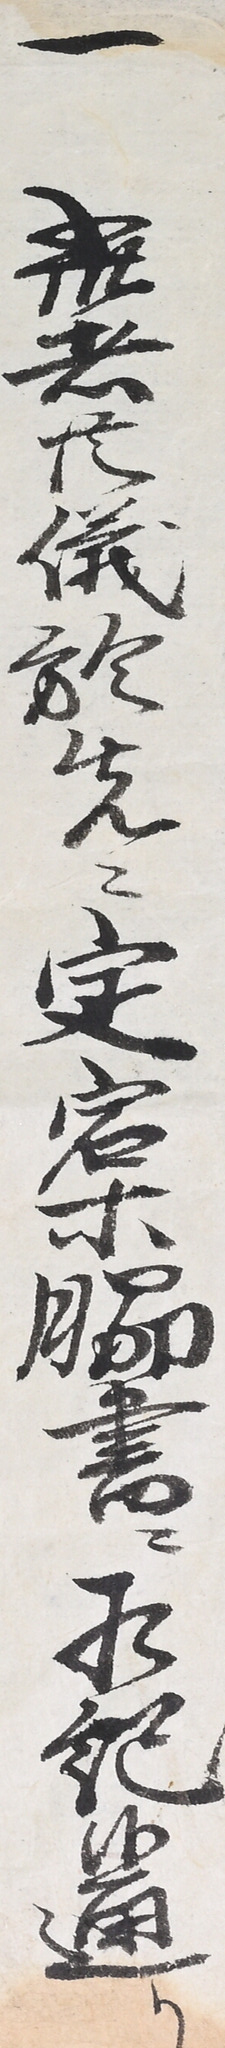一此者共儀於先々定宿等脇書ニ相記候通り
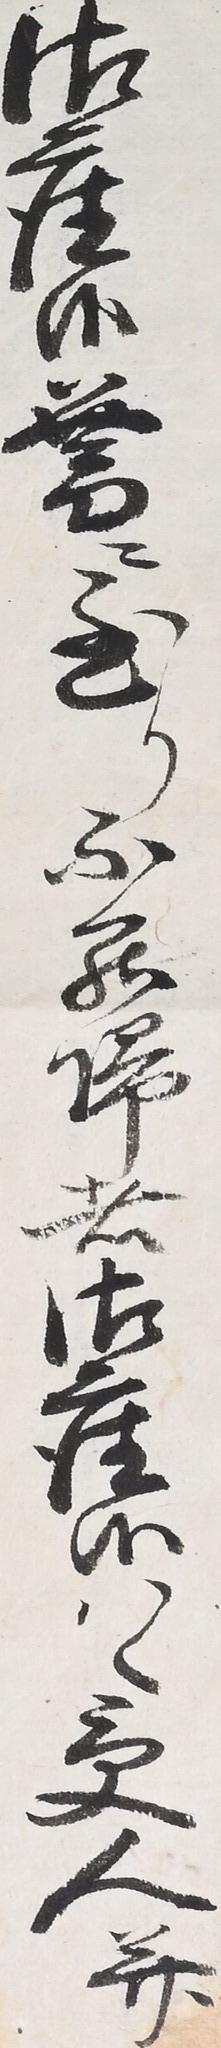御座候暮ニ至り不罷帰者御座候ハゝ受人并
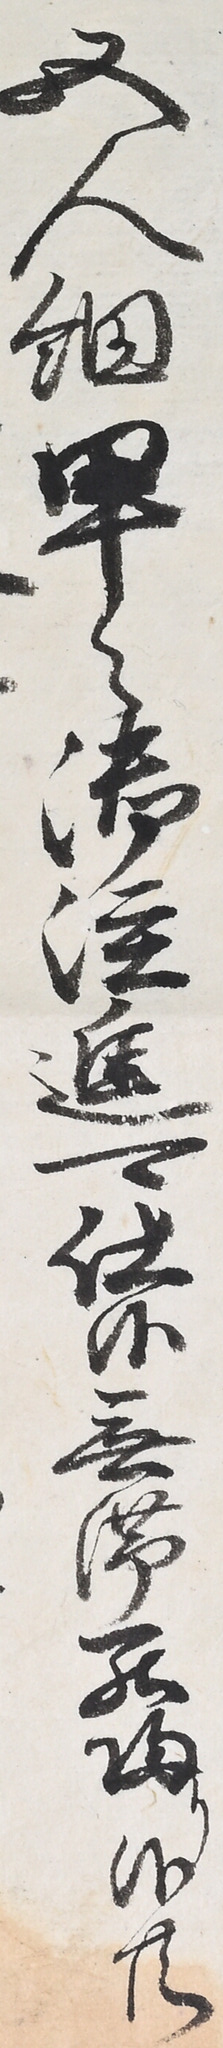五人組早々御注進可仕候無滞罷帰り候共
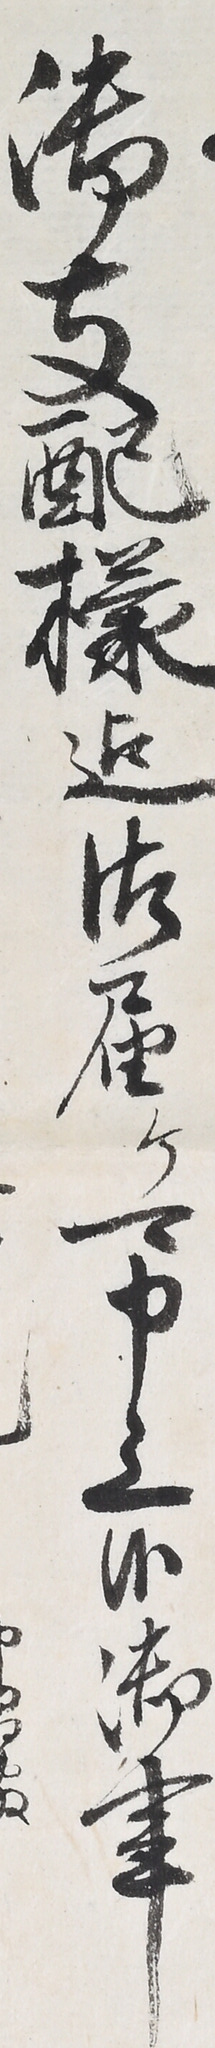御支配様迄御届ケ可申上候於御事
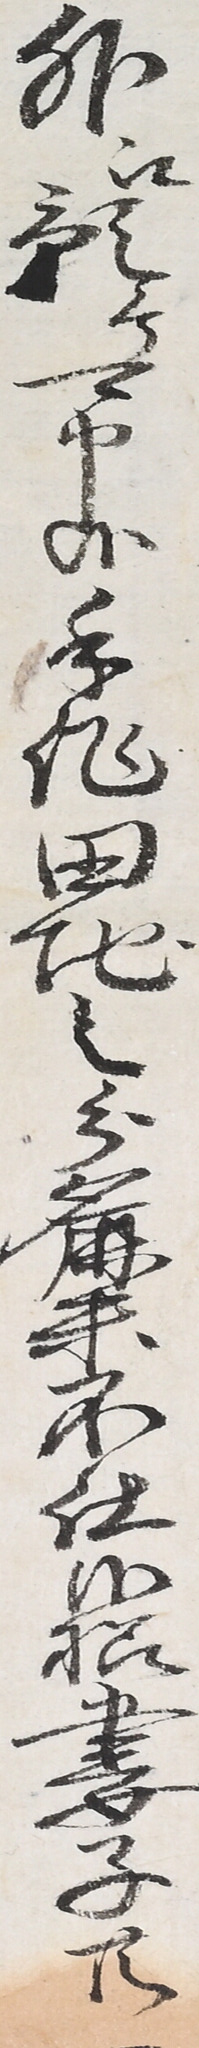外え預ケ可申候手作田地之分麤末不仕候様妻子共ニ
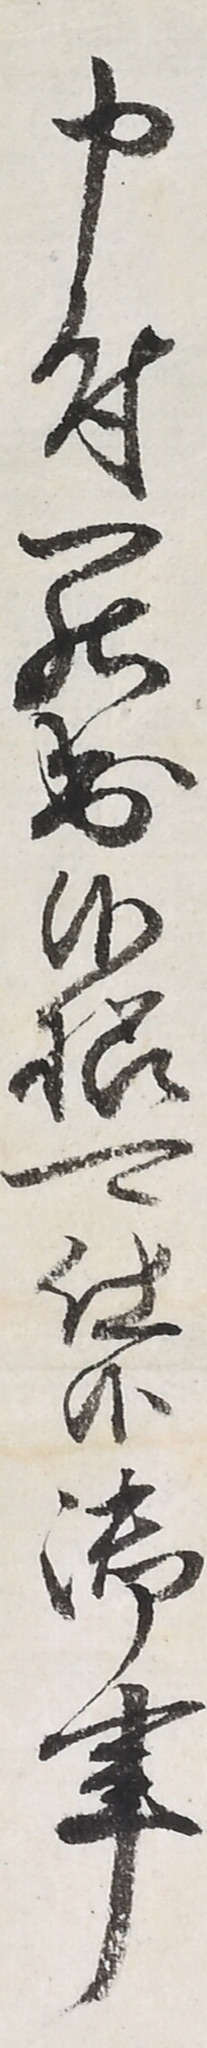申付罷出候様可仕候御事

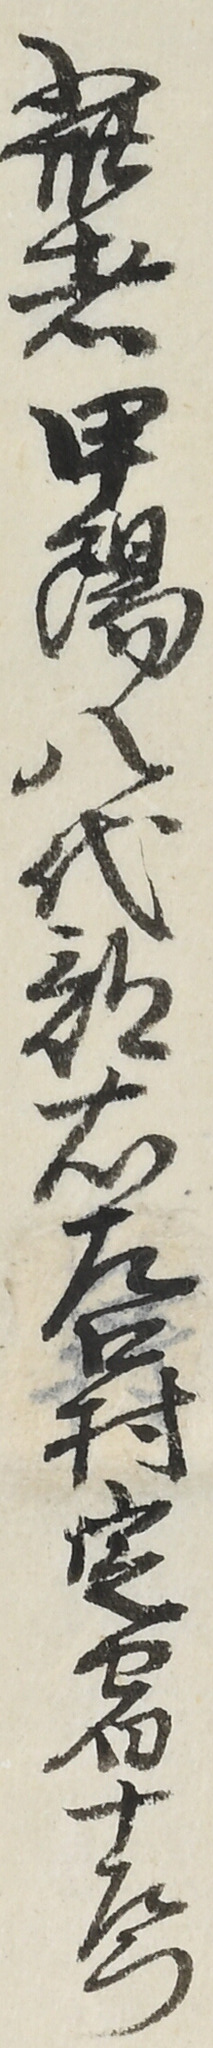此者甲陽八代郡右左口村定宿十左衛門
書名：弘化五戊申年正月他國出石切名前書上帳
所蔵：伊那市立高遠町図書館・合同会社AMANE
